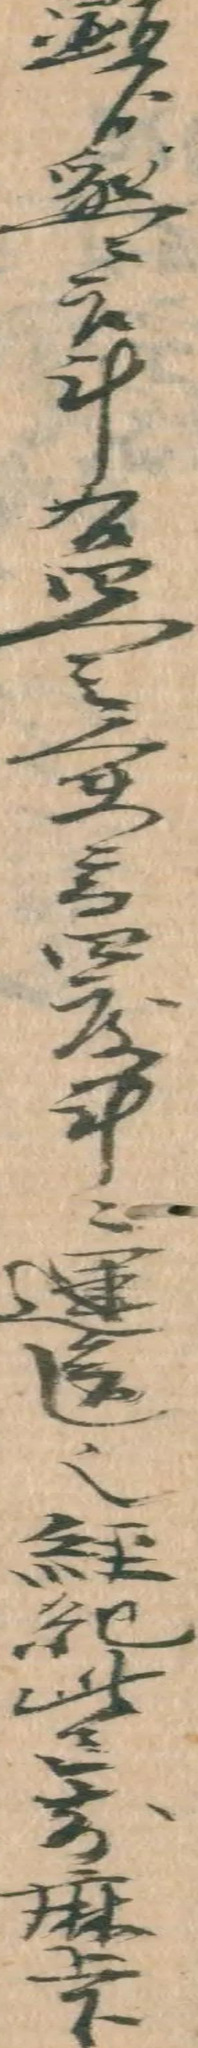顕ゟ懇ニ取斗右四人之人夫ニ而四度斗ニ運送也経紀此已前麻上下
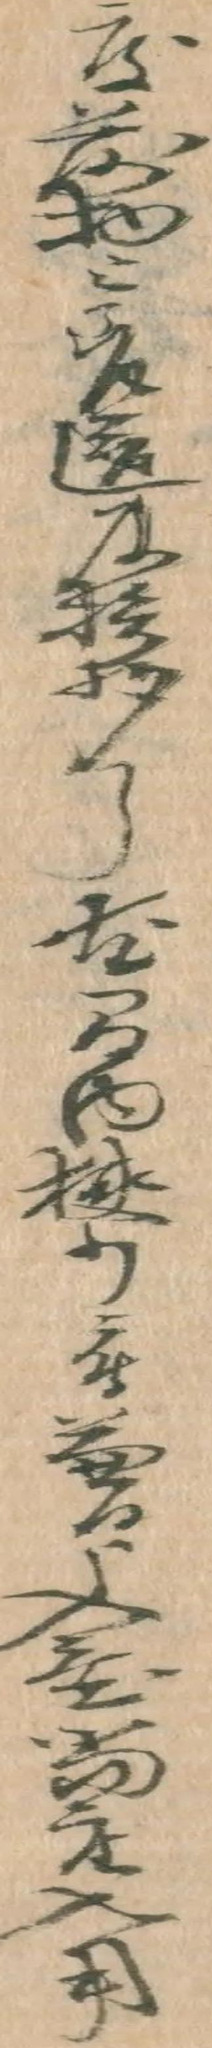度荷物被差送及挨拶了尤間内狭少ニ付兼而申入置當座入用
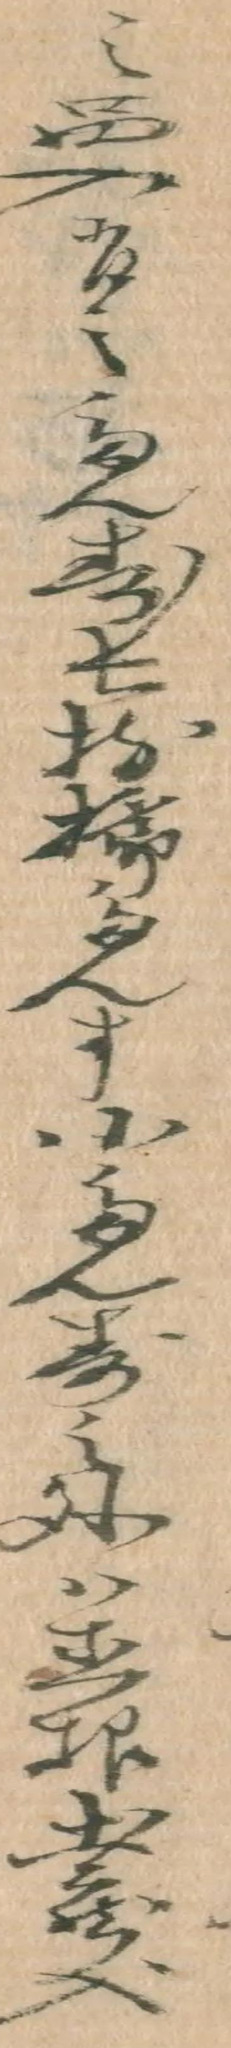之品入有之たんす長持櫛たんす小たんす之外は直様土蔵ヘ入
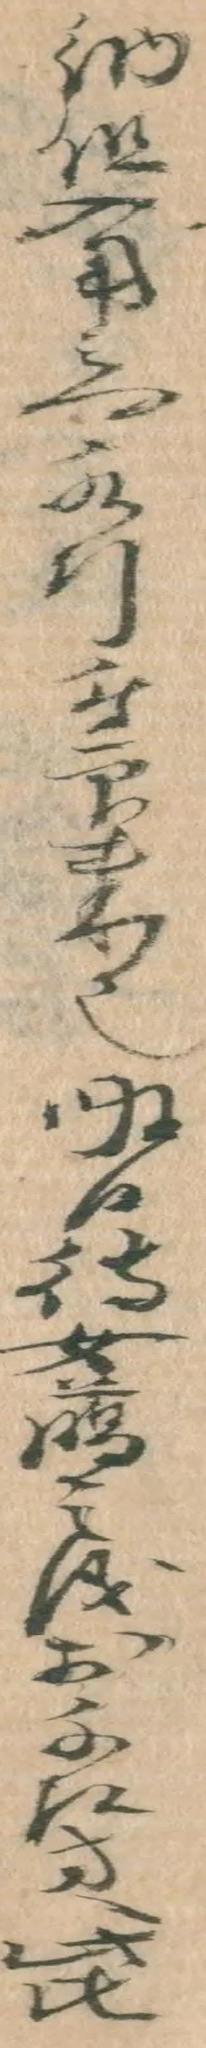納但入用之向水引付印来也明日待女臈之儀おちえ方へ此比
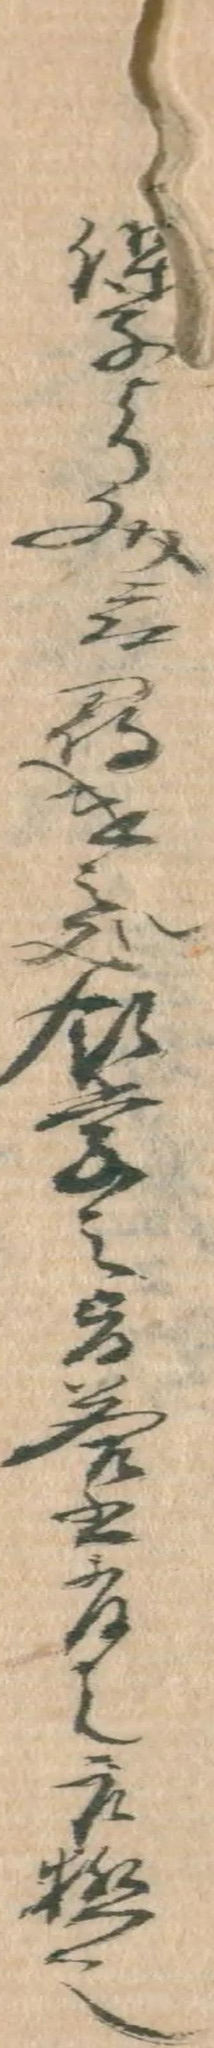保子より文ニ而尋遣之処領掌之旨答書有之取極也
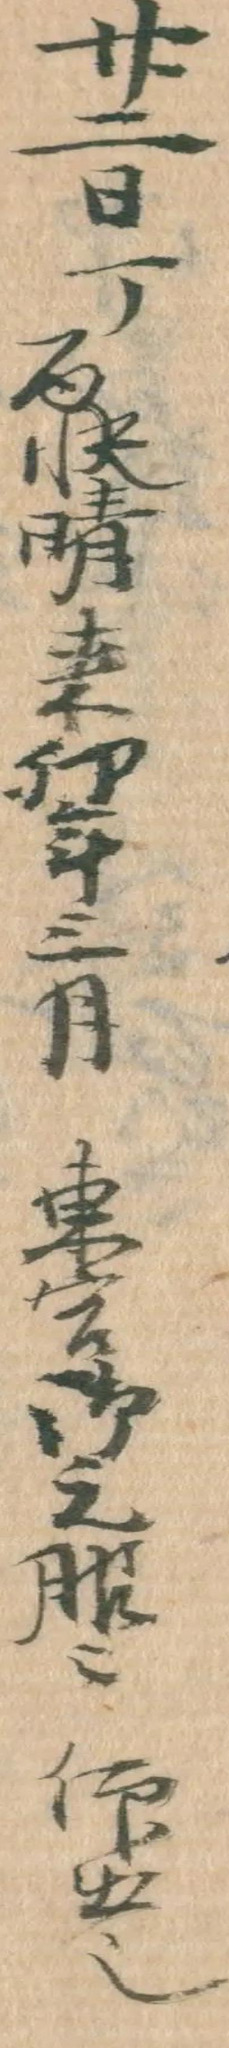廿二日丁酉快晴桑卯年三月東宮御元服被仰出也
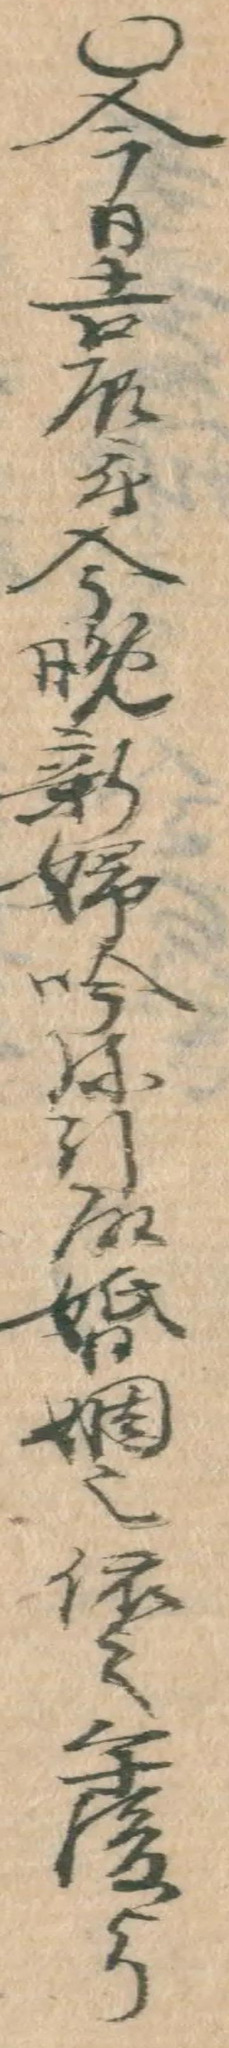○今日吉辰ニ付今晩新婦吟弥引取婚姻也依之午後より
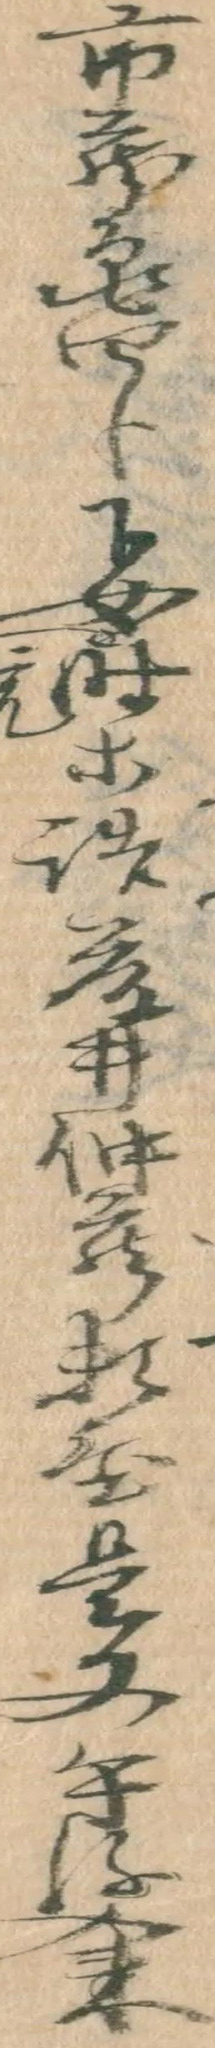市蔵亀四郎下女虎時等詰藤井仲蔵頼置是又午後入来
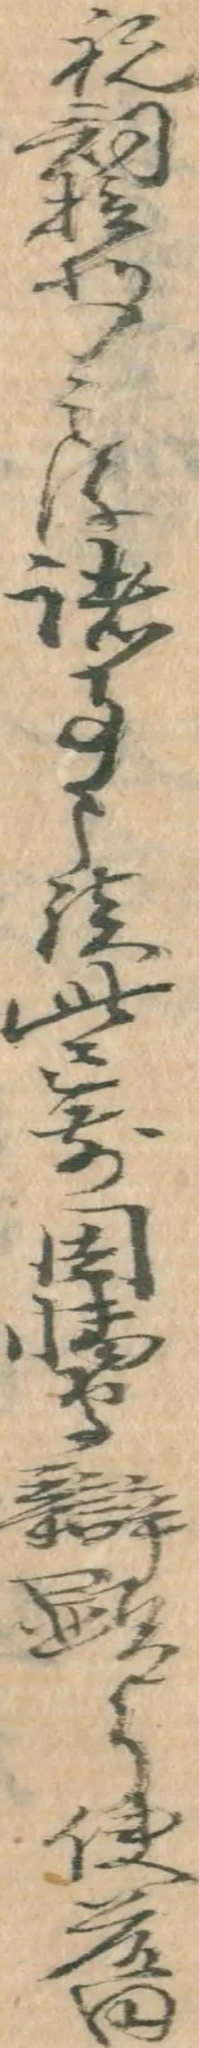祝詞挨拶之後諸事申談此已前因幡守辨顕より使藤田
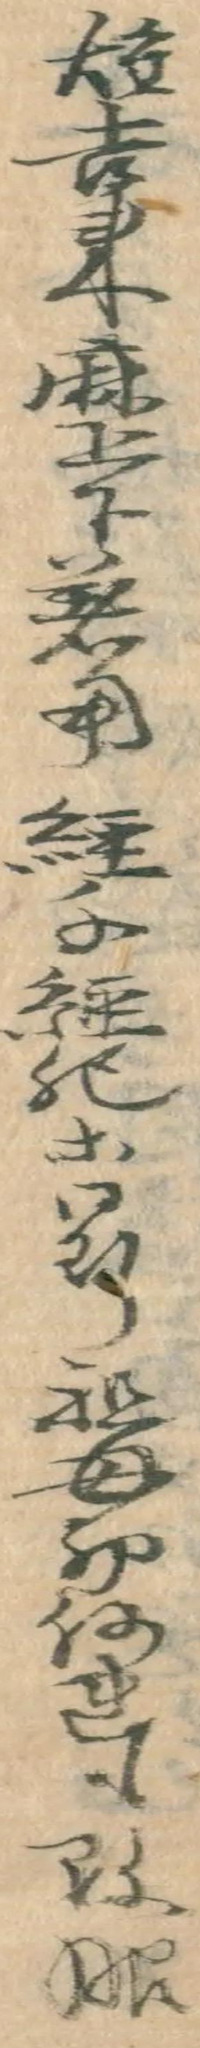雄吉来麻上下着用経千経紀等同断祖母初何れも改服

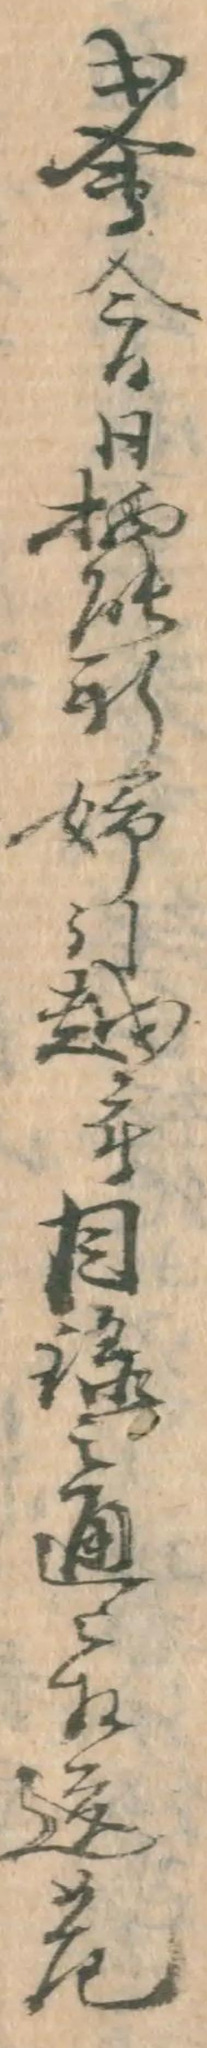出會今日日柄能新婦引越ニ付目録之通被相送如左
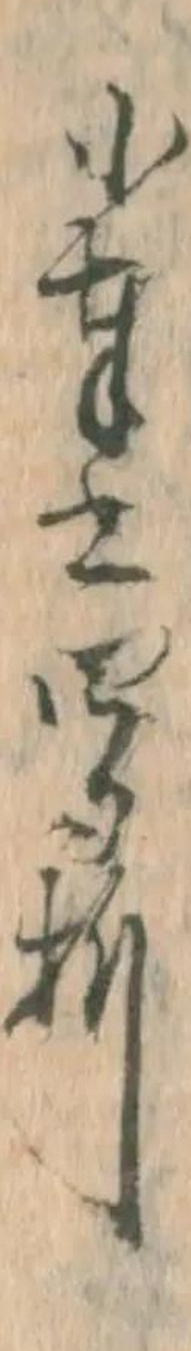小奉書四ツ折
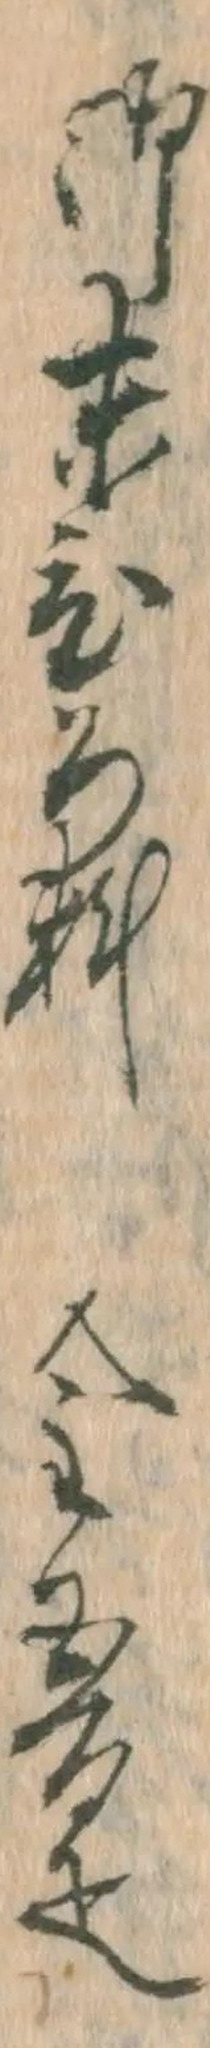御末ひろ料金五百疋
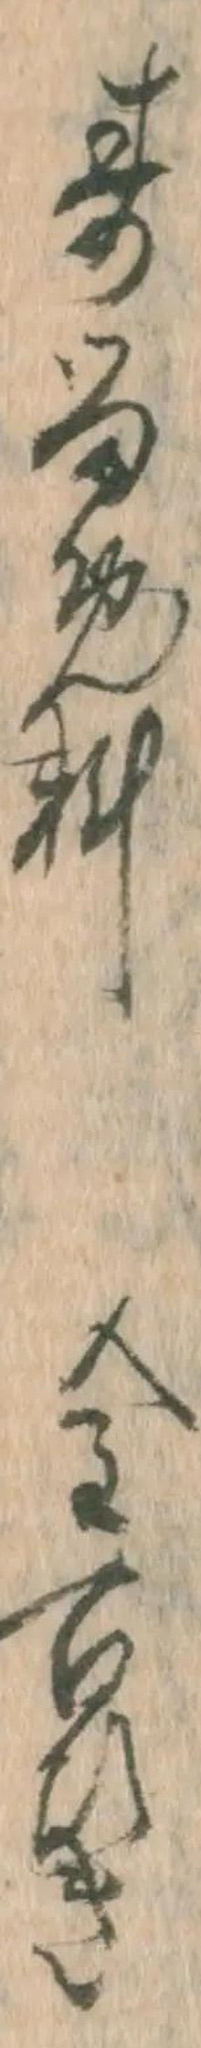寿とめ料金百ひき
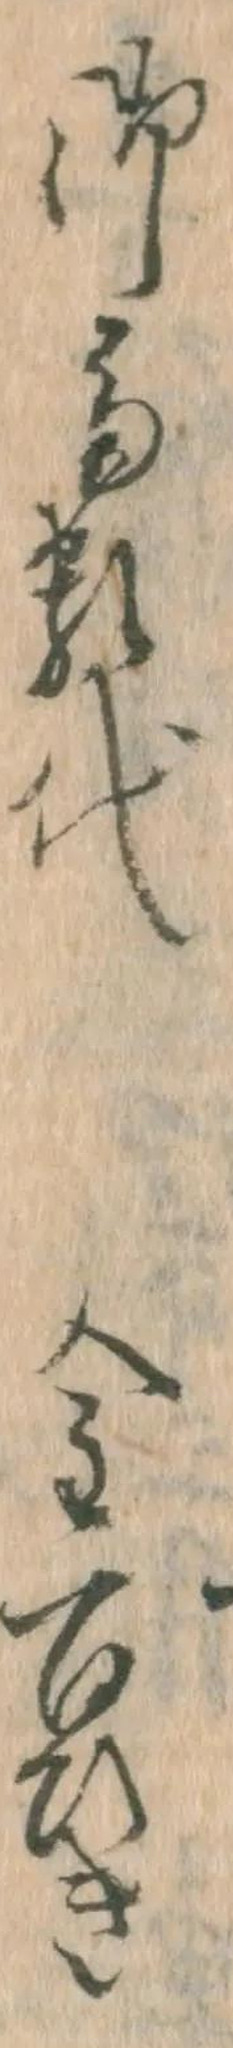御たる代金百ひき
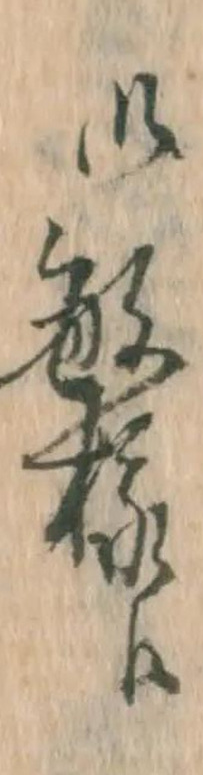御敏様え
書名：賀茂社記録. 第69冊
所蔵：国立国会図書館 National Diet Library, JAPAN
